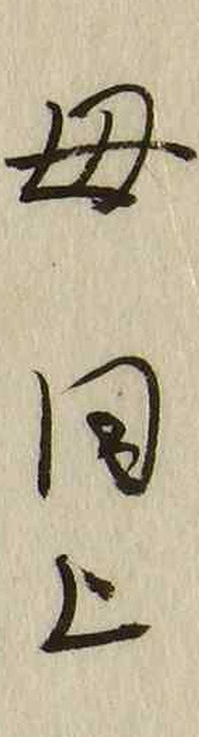母同上
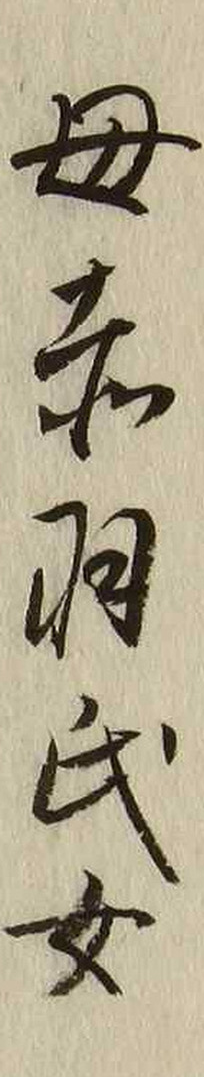母赤羽氏女
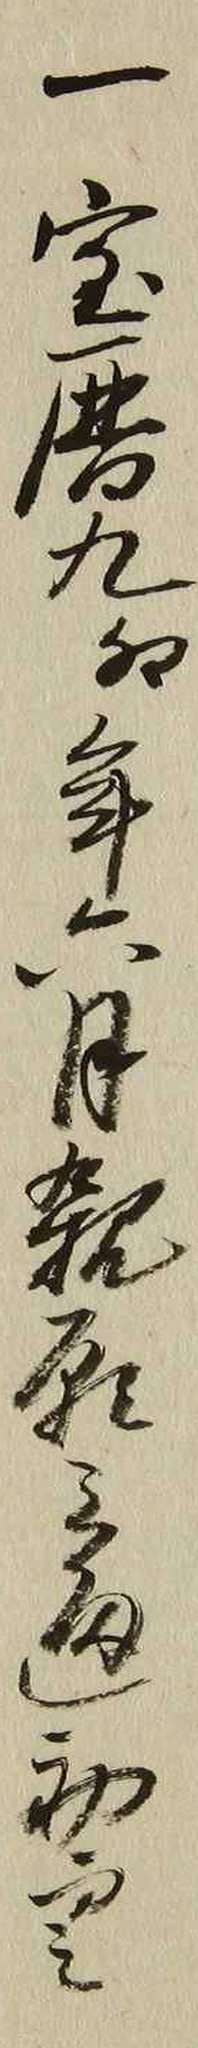一宝暦九卯年六月親願之通初而之
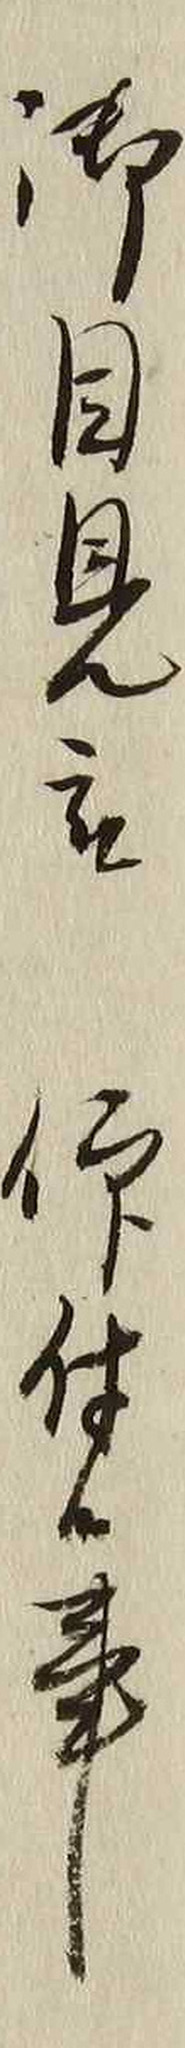御目見被仰付候事
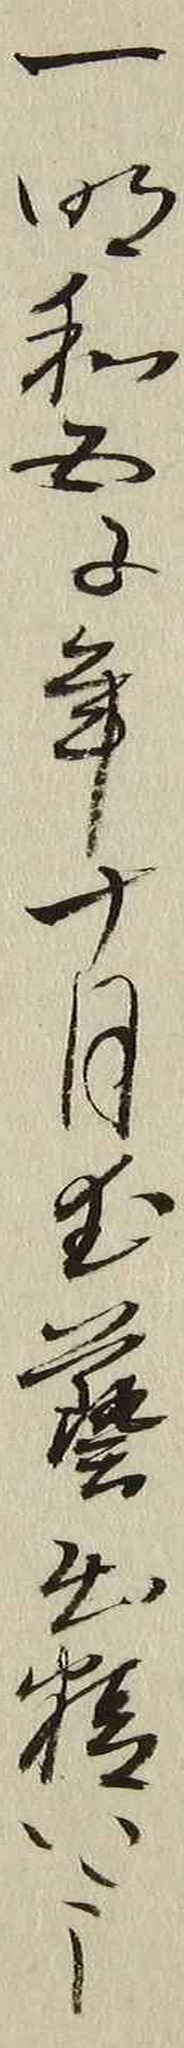一明和五子年十月武芸出精いたし
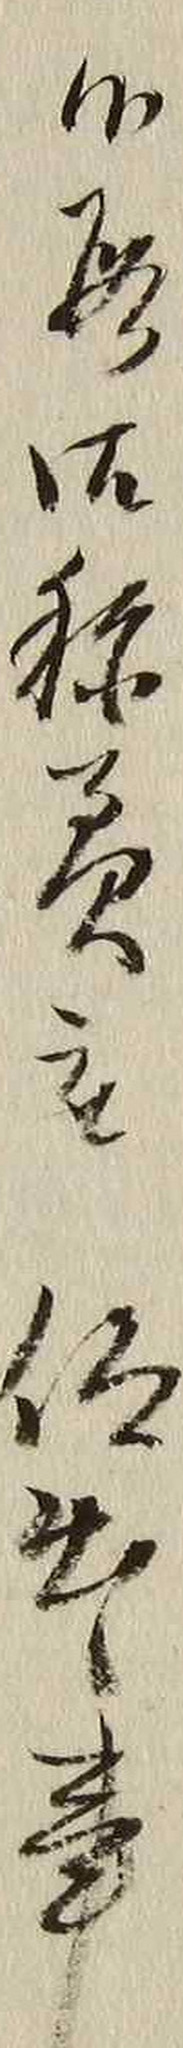候段御称美被仰出候事
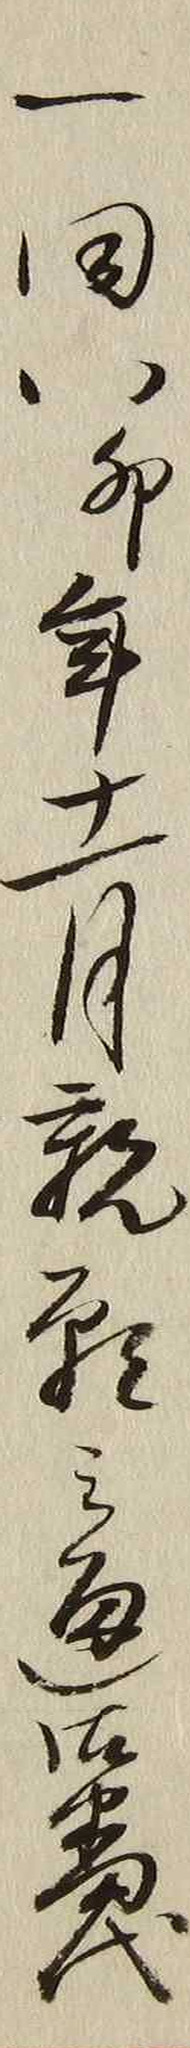一同八卯年十一月親願之通御番代
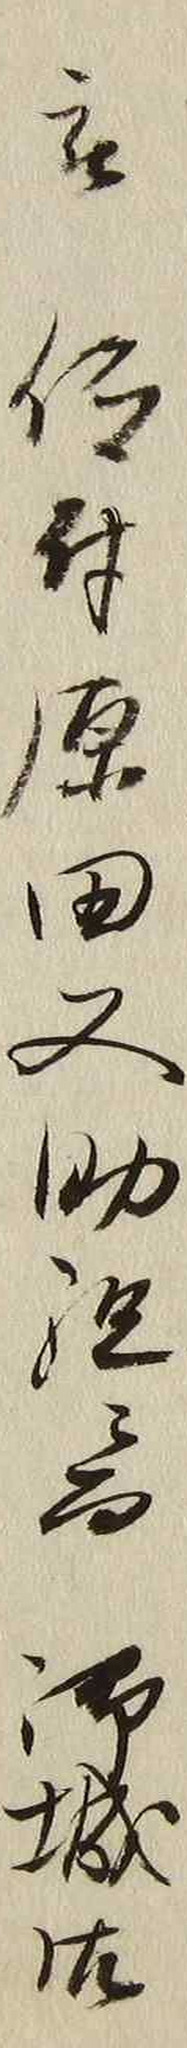被仰付原田又助組二而御城御
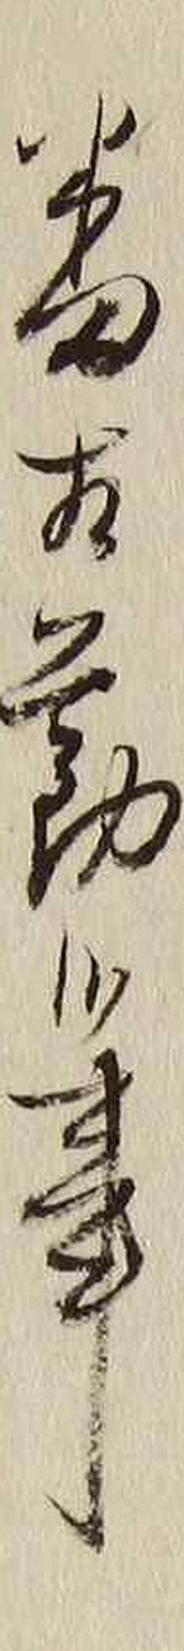番相勤候事
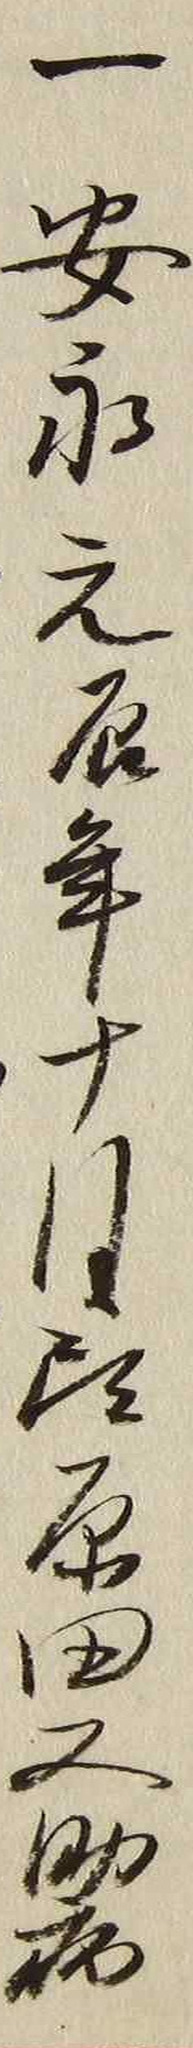一安永元辰年十月頭原田又助病
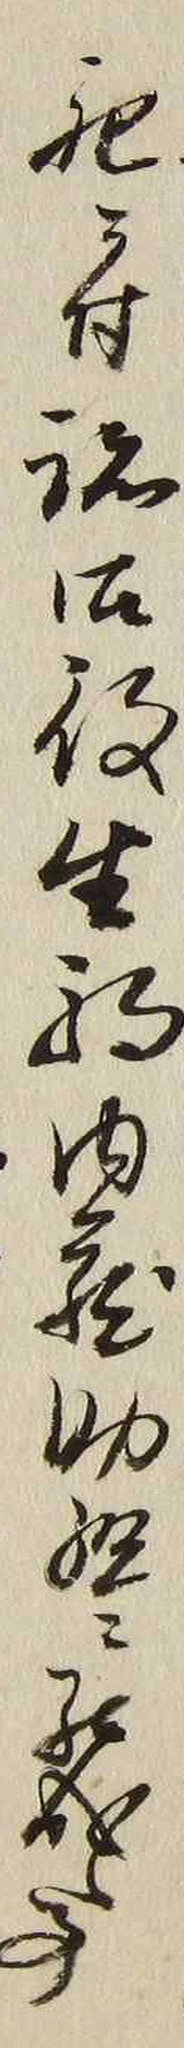死ニ付跡御役生駒内蔵助組ニ罷成候事
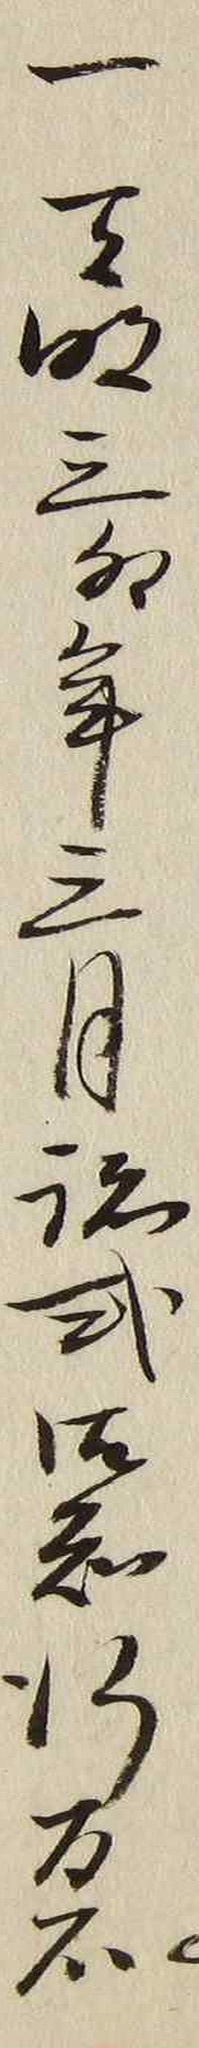一天明三卯年三月跡式御知行百石
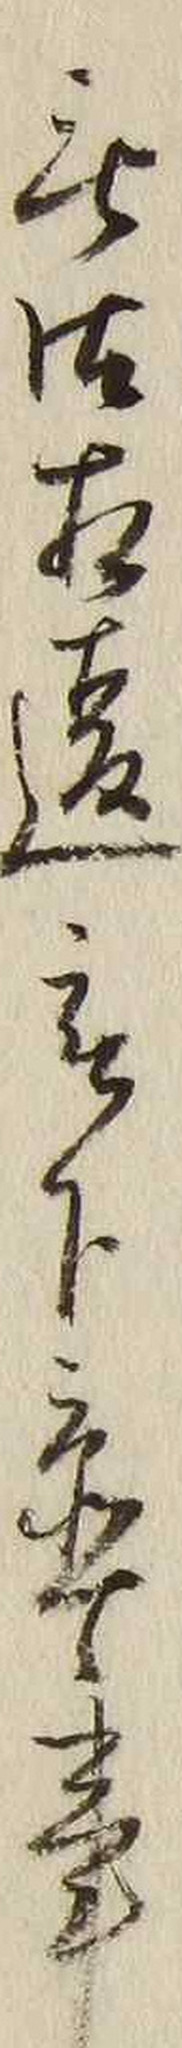無御相違被下置候事

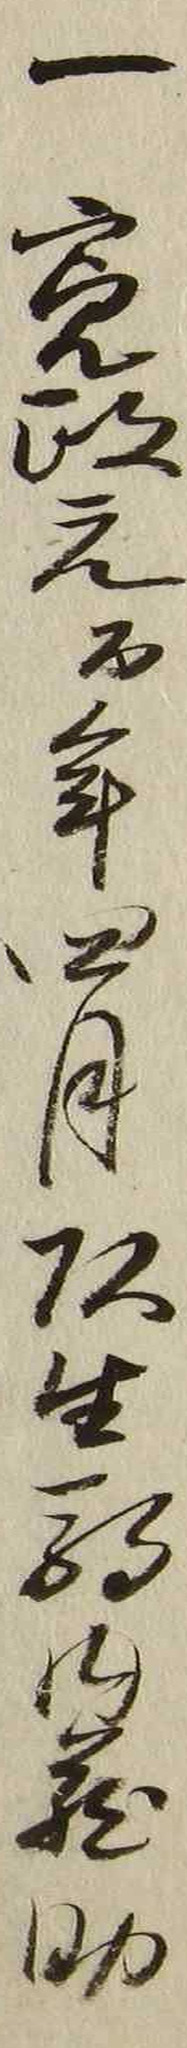一寛政元酉年四月頭生駒内蔵助
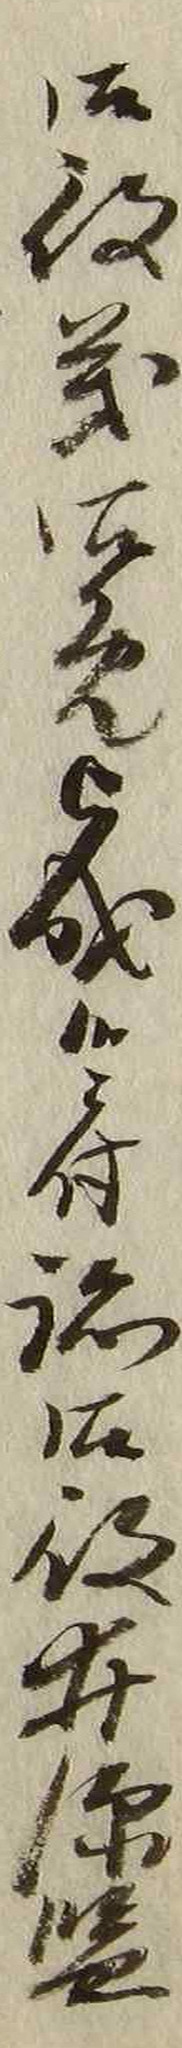御役義御免被成候ニ付跡御役井深監
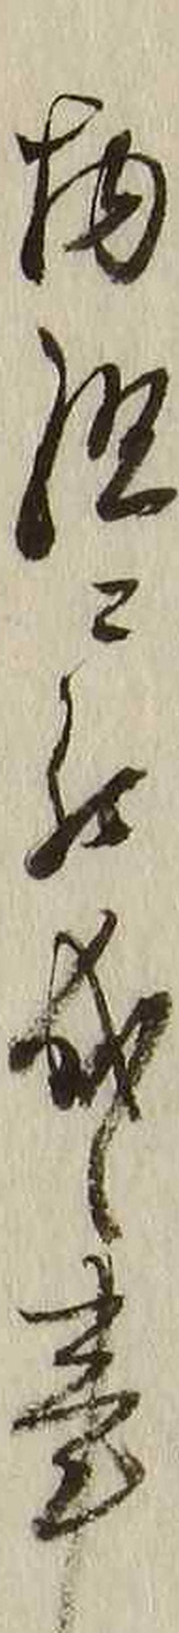物組ニ罷成候事
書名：諸士系譜　巻之352　す之部2
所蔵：会津若松市立会津図書館
